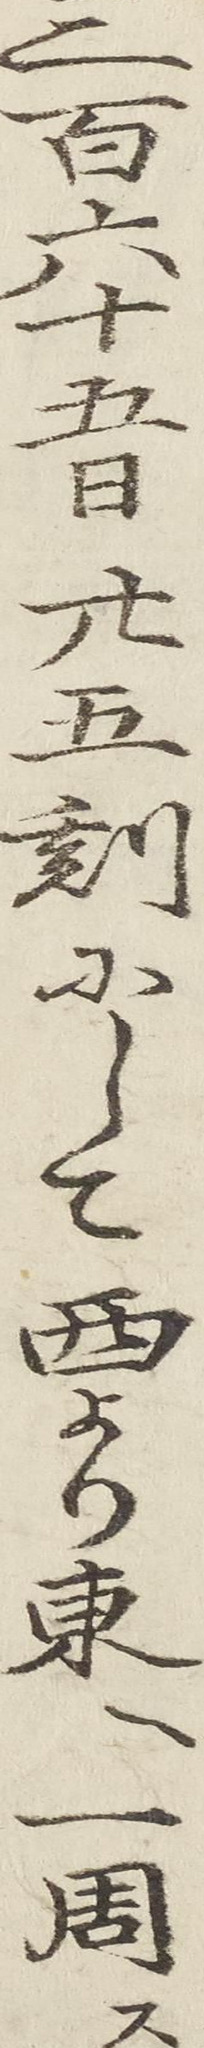大陽三百六十五日廿五刻にして西より東へ一周ス
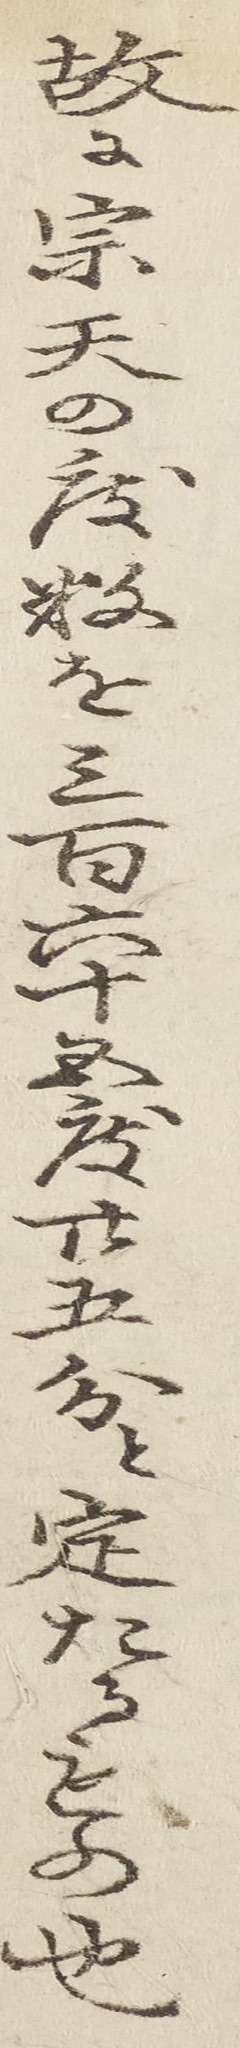故に宗天の度数を三百六十五度廿五分と定たるもの也
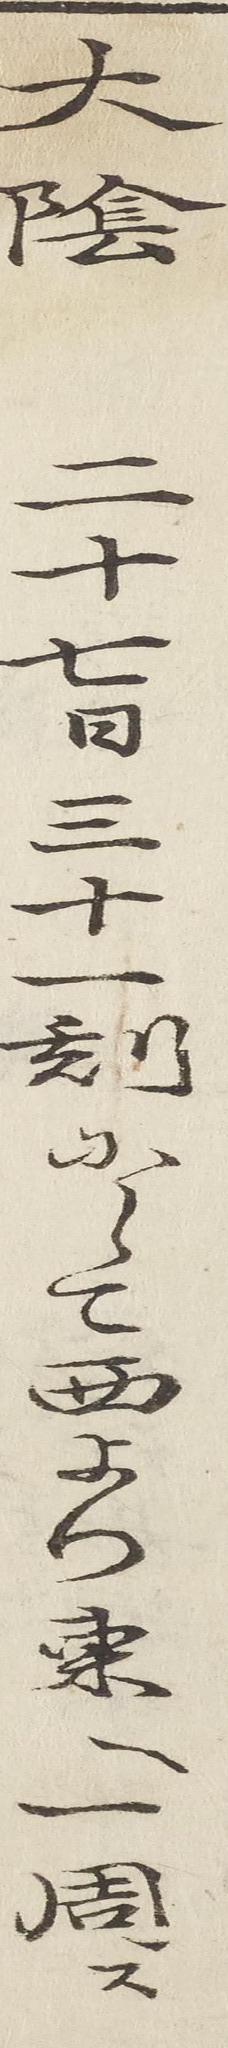大陰二十七日三十一刻にして西より東へ一周ス
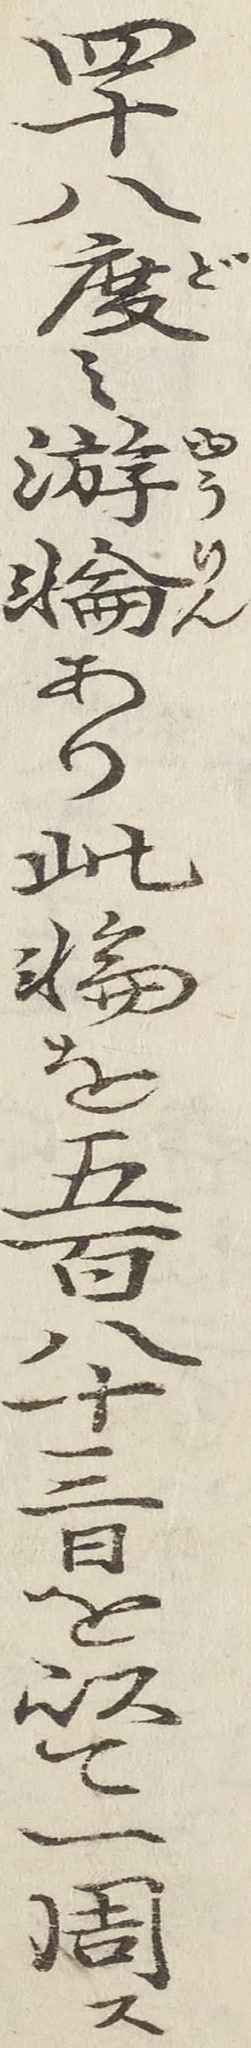金星四十八度之游輪あり此輪を五百八十三日を以て一周ス
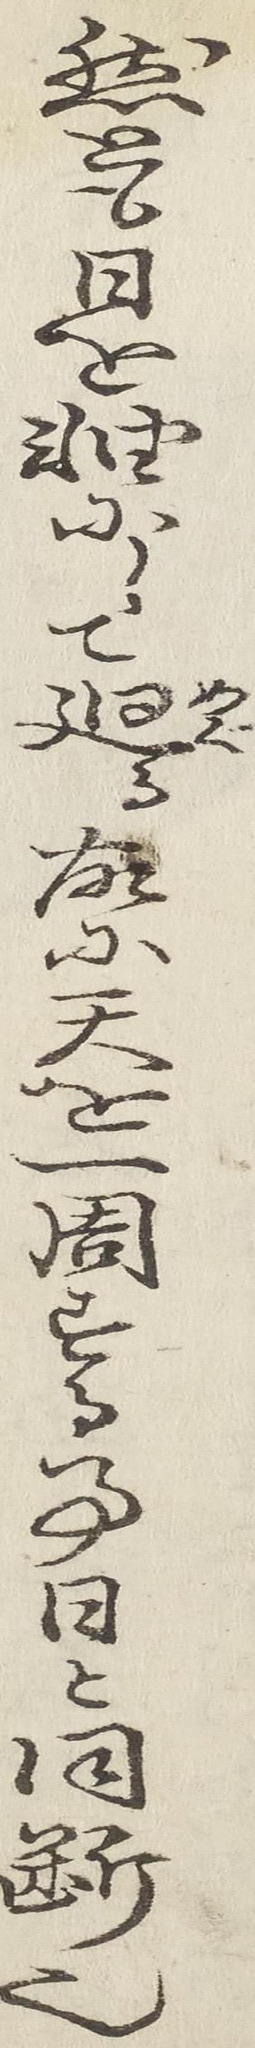然とも日を軸にして廻る故に天を一周する事日と同断也
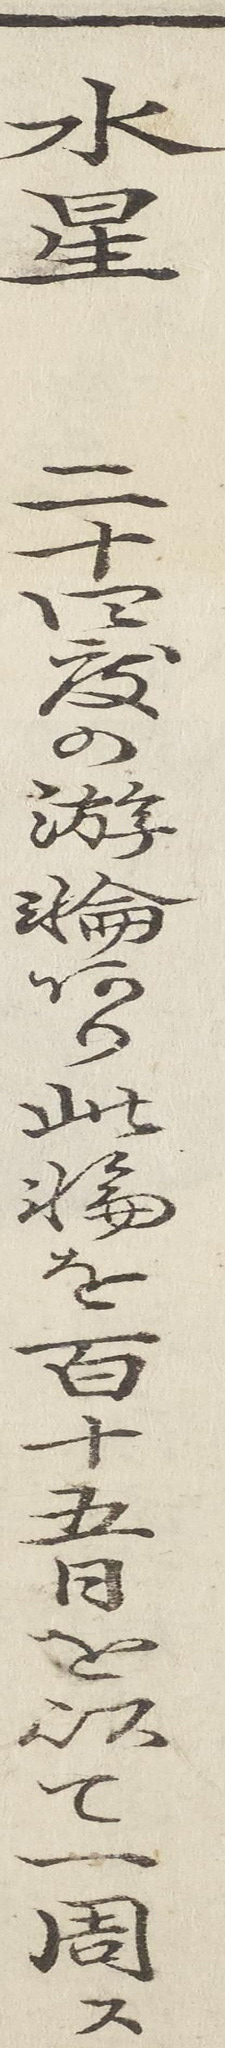水星二十四度の游輪あり此輪を百十五日を以て一周ス
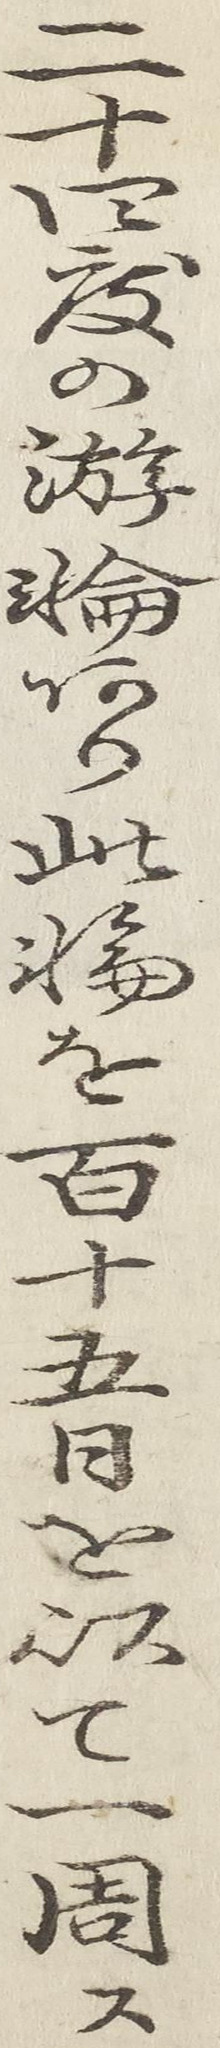水星二十四度の游輪あり此輪を百十五日を以て一周ス
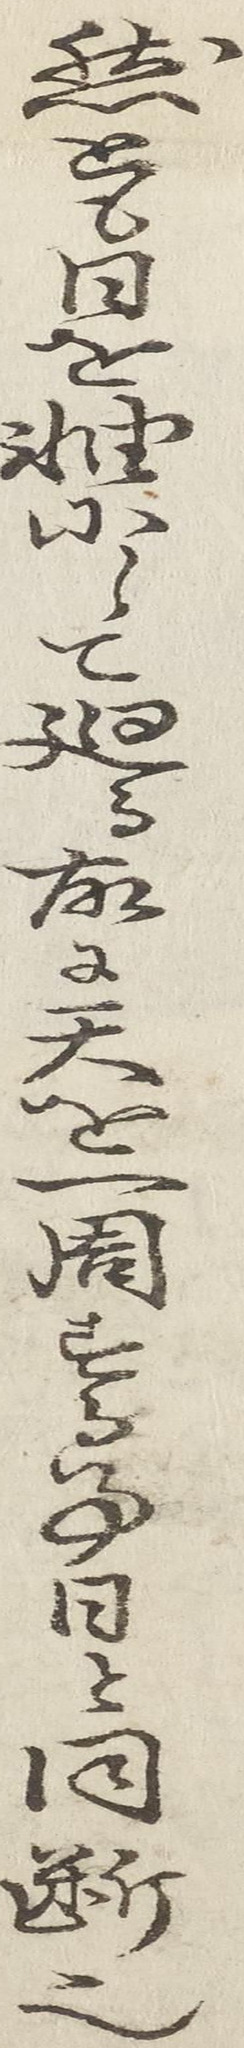然とも日を軸にして廻る故に天を一周する事日と同断也
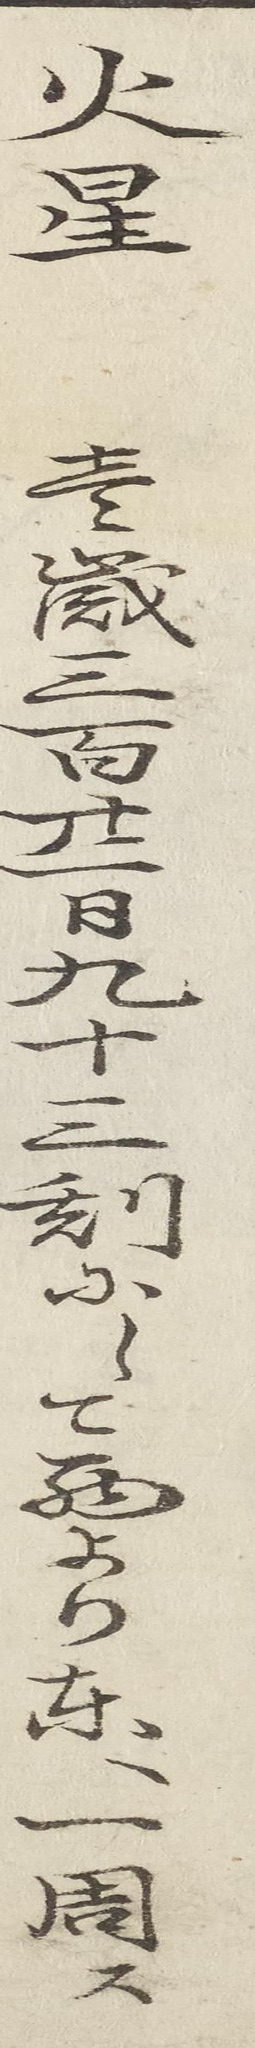火星壱歳三百廿一日九十三刻にして西より東へ一周ス
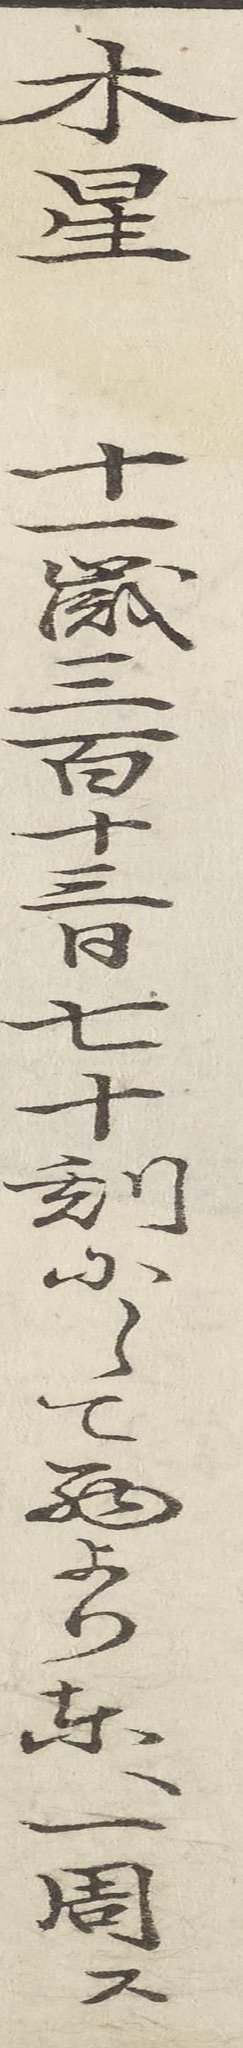木星十一歳三百十三日七十刻にして西より東へ一周ス
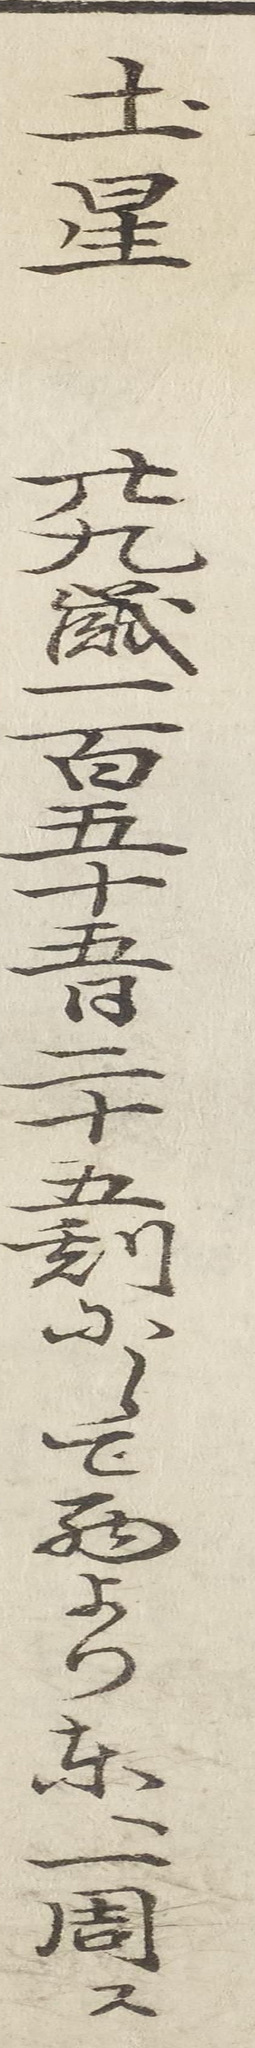土星廿九歳一百五十五日二十五刻にして西より東へ一周ス
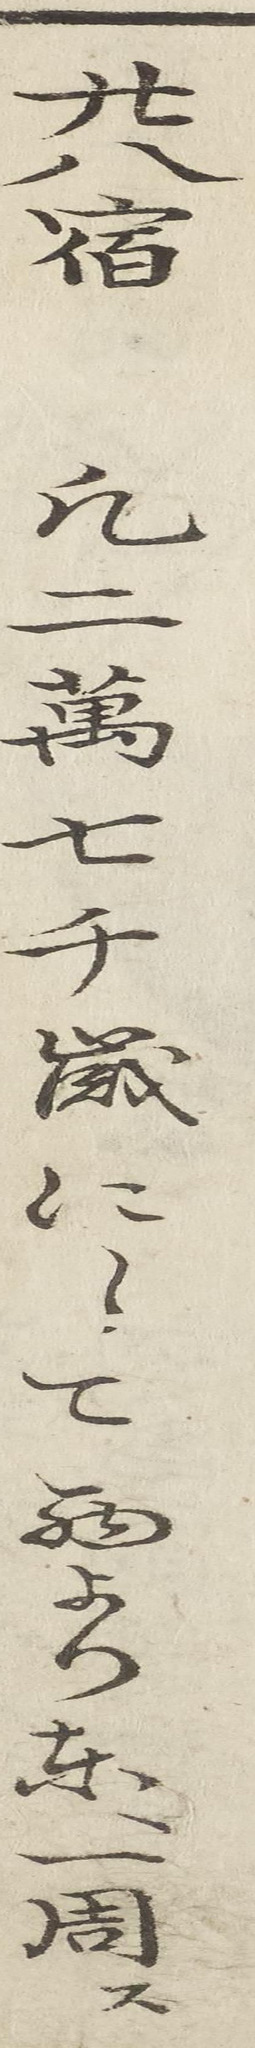廿八宿凡二万七千歳にして西より東へ一周ス
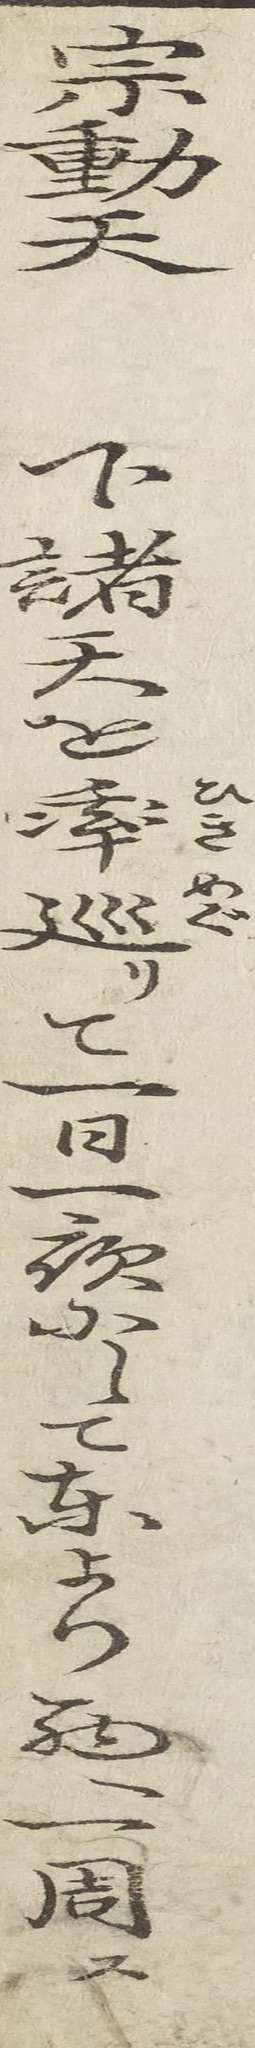宗動天下諸天を率巡リて一日一夜にして東より西へ一周ス

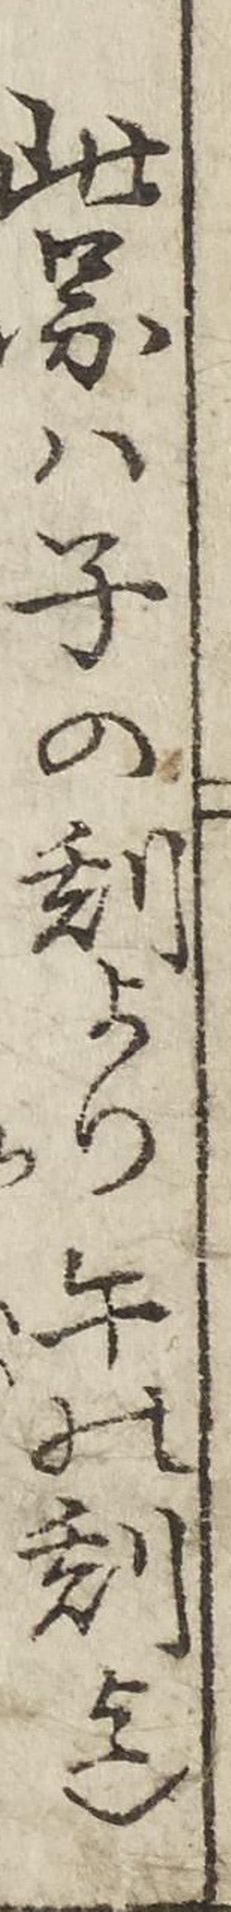此図は子の刻より午の刻迄
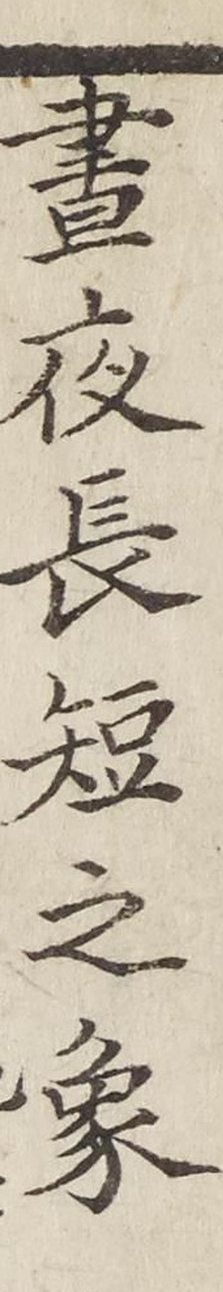昼夜長短之象
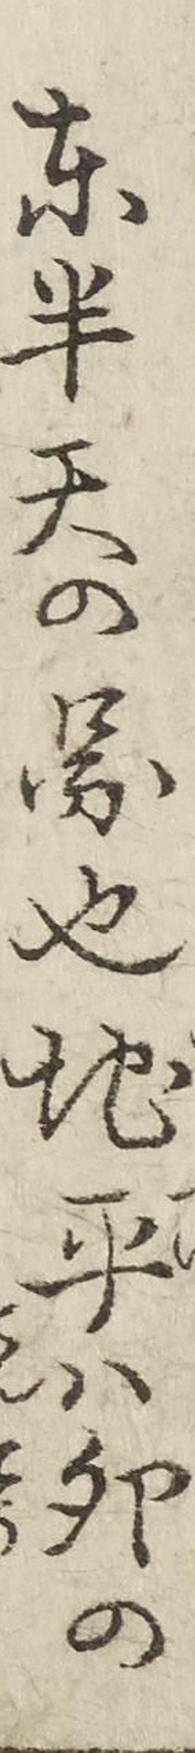東半天の図也地平は卯の
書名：平天儀圖解
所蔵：東京大学地震研究所図書室 Earthquake Research Institute Library, The University of Tokyo, JAPAN
